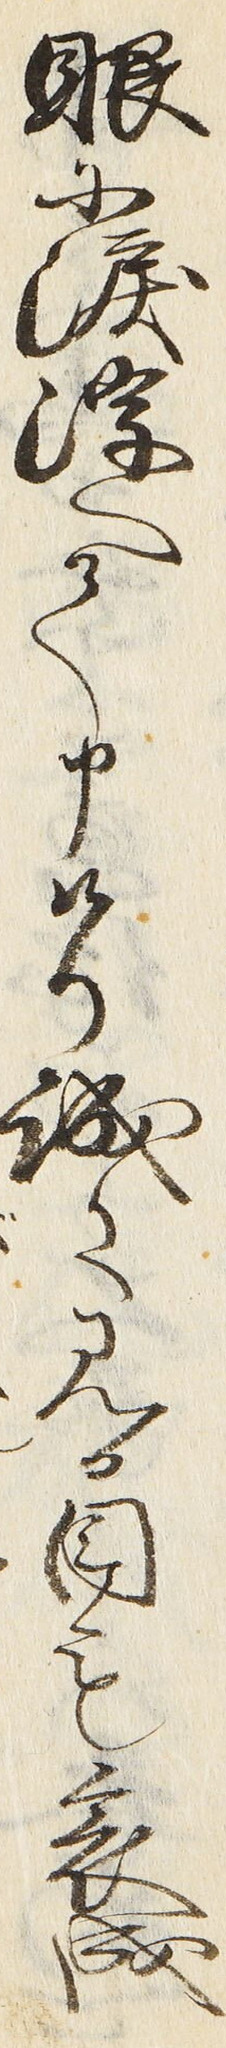眼に涙浮へて申けり誠に見る目も哀成
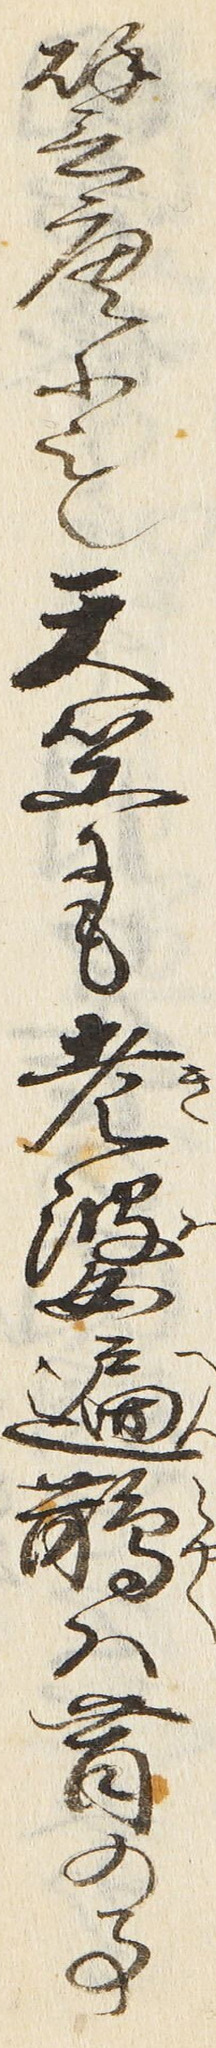璧唐にも天竺にも耆婆扁鵲は昔の事
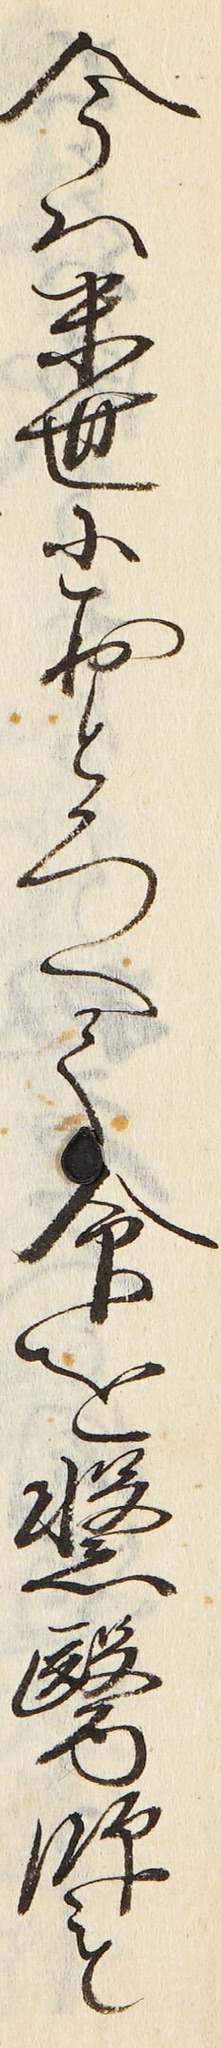今は末世におとろへて命を奨医師も
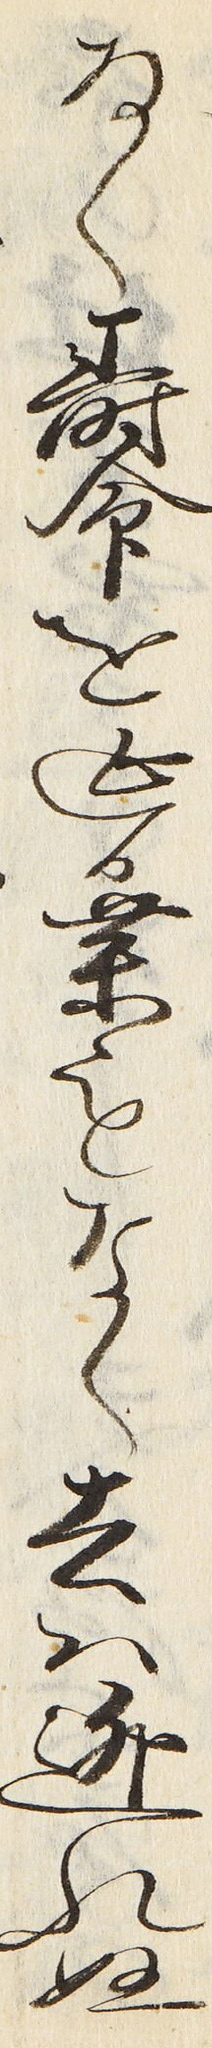なく寿命を辿る薬もなく去は逃れぬ
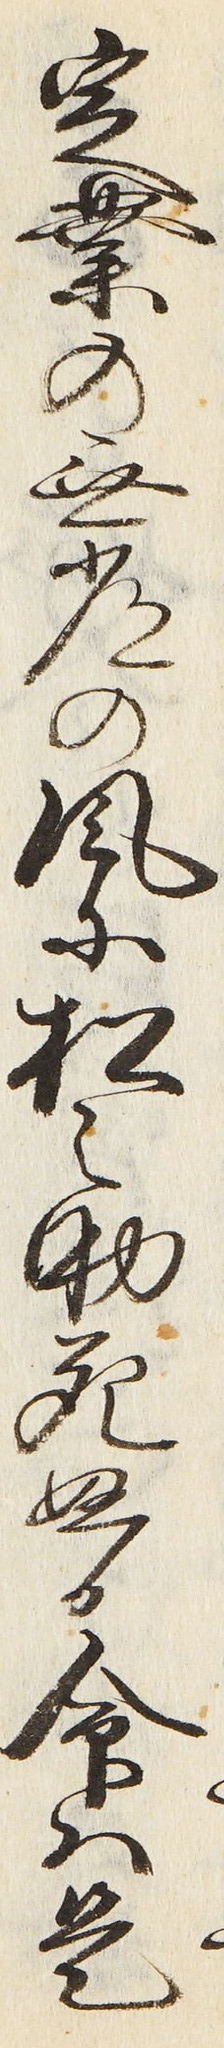定業の無道の風に松之助死ぬる命は是
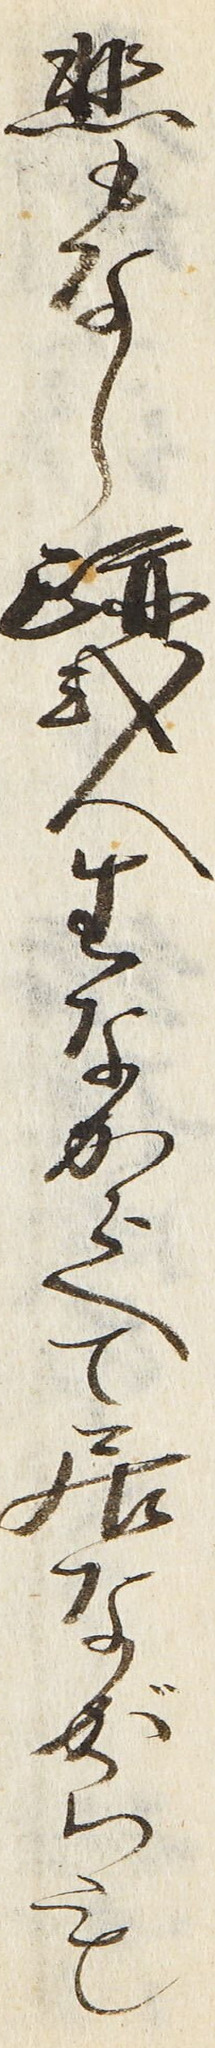悲もなし跡弐人生なからへて居ながらも
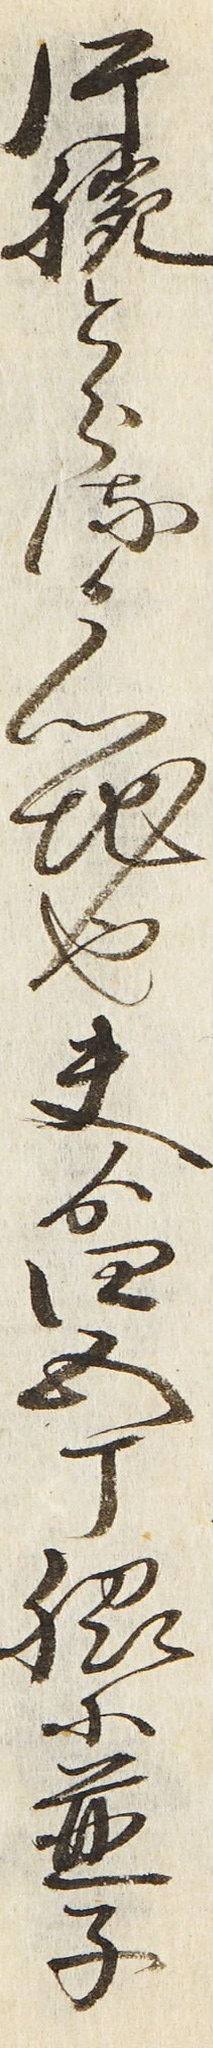片腕とらるゝ心地也夫ゟ四五丁脇に並子
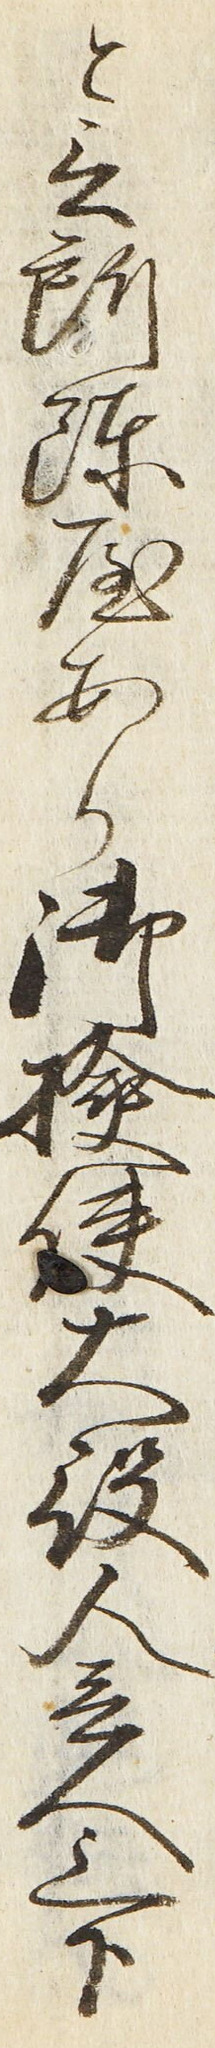と云所陣屋あり御検使大役人壱人上下
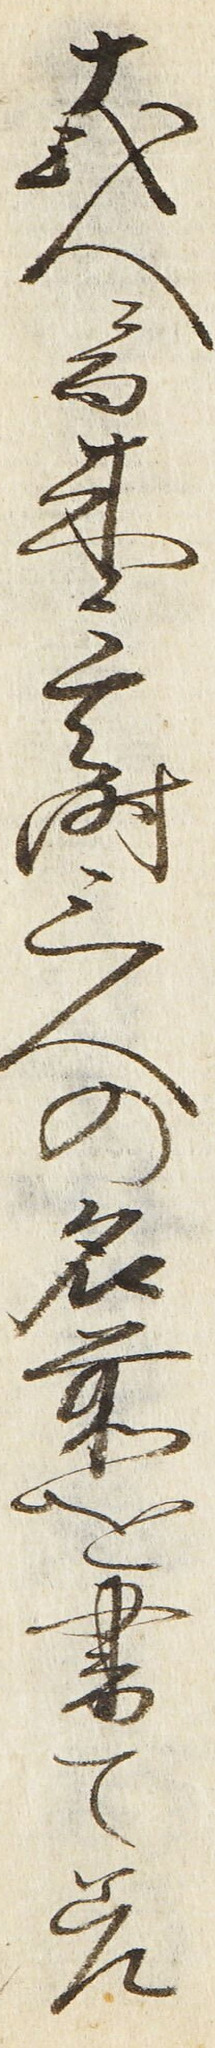十弐人にて来其時三人の名前を書て差
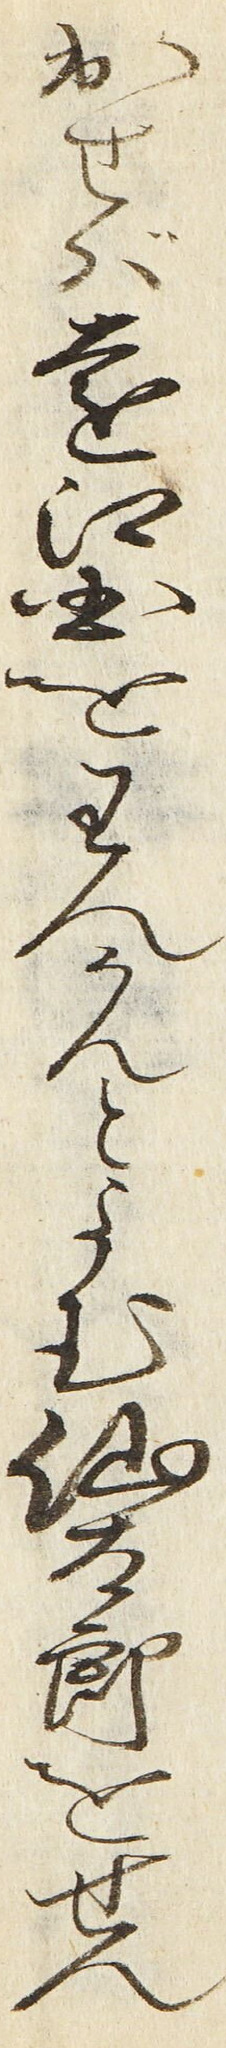出せば遠江国をわんかんとよむ仙太郎せん

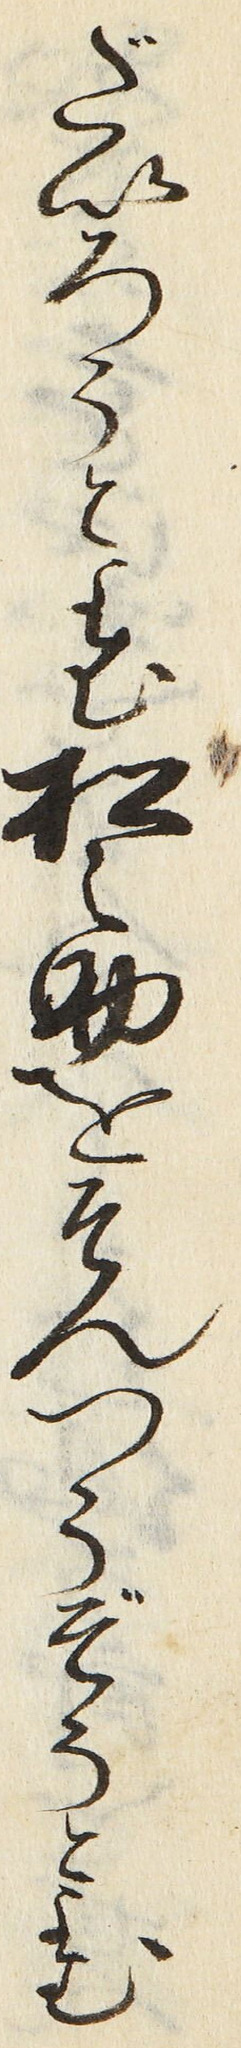だいろうとよむ松之助をそんつうぞうとよむ
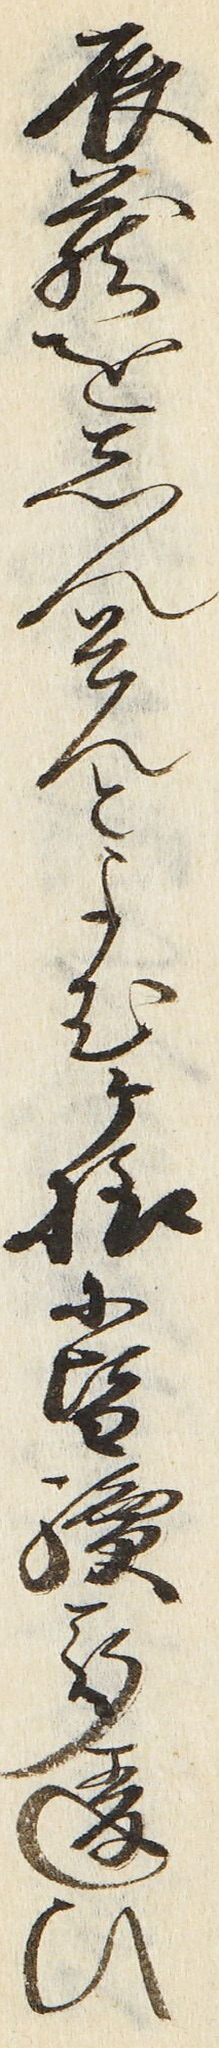辰蔵をしんそんとよむケ様に皆読聞違ひ
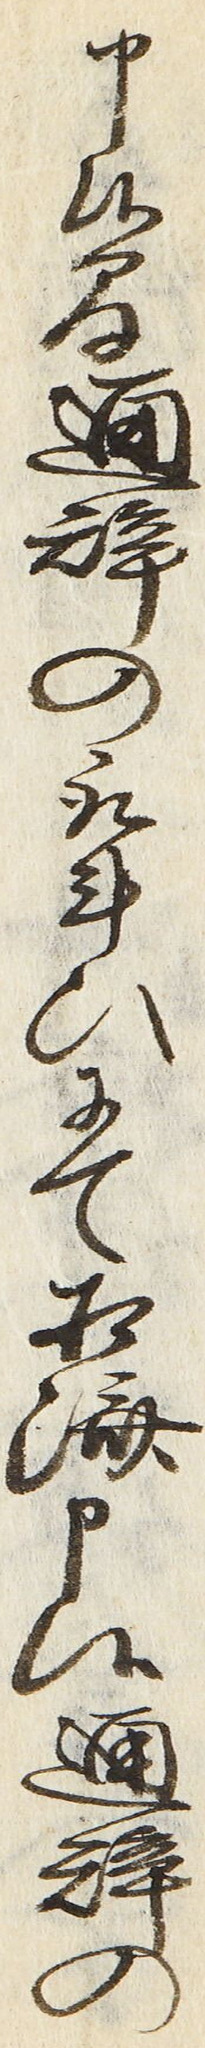申候間通辞の取計ひにて相済申候通辞の
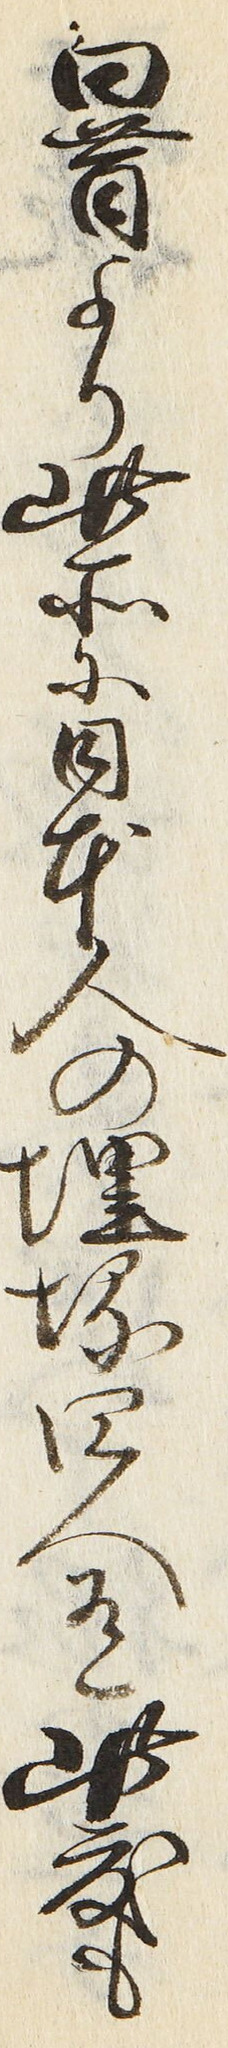曰昔より此所に日本人の埋塚四人有此度も
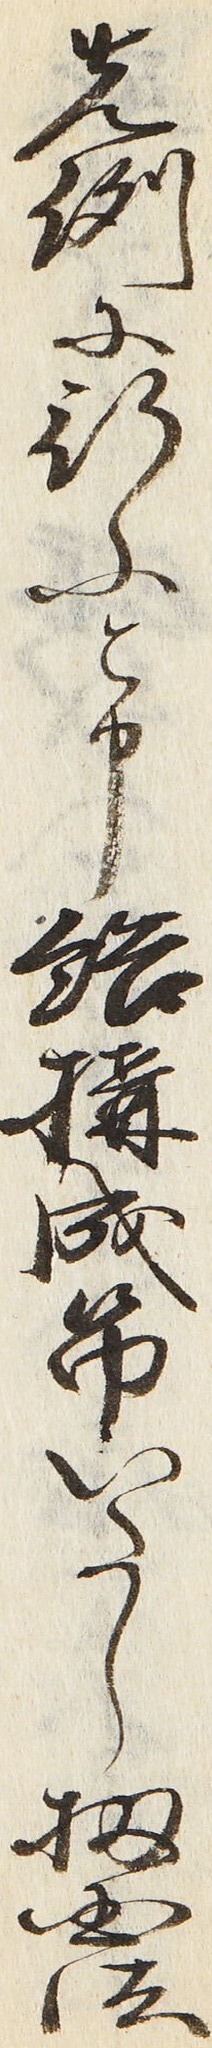先例に行ふと申結構成弔いたし扨国法
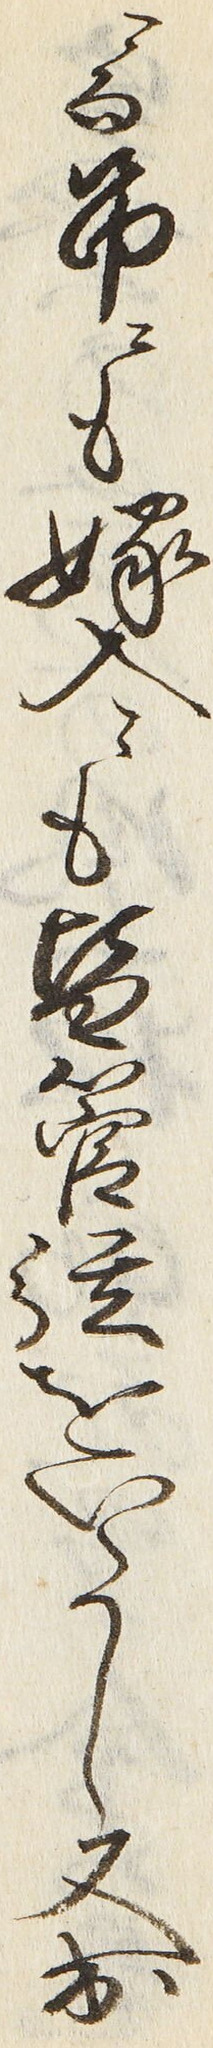にて弔にも嫁入にも皆管弦をいたし又出
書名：天保漂流記
